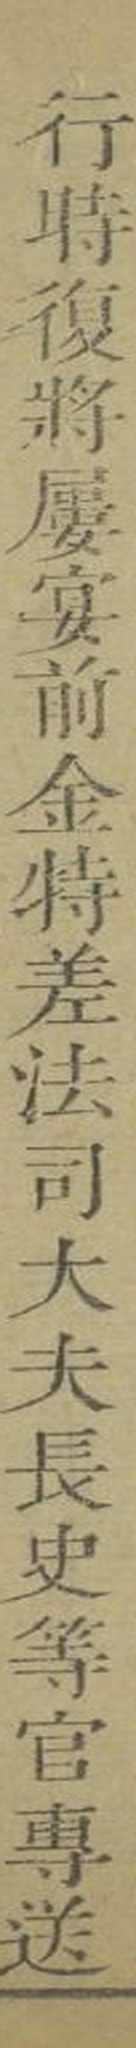行時復將屢宴前金特差法司大夫長史等官專送
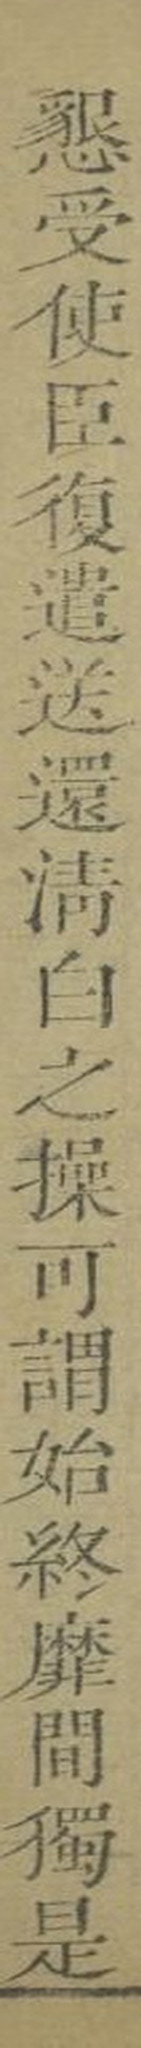懇受使臣復遣送還淸白之操可謂始終靡間獨是
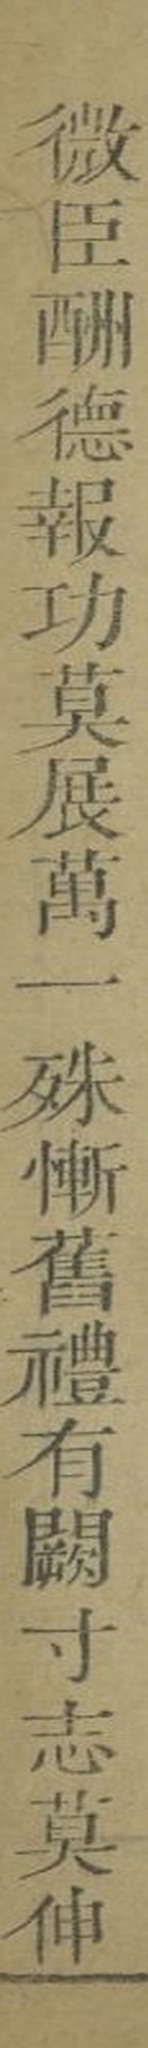微臣酬德報功莫展萬一殊慚舊禮有闕寸志莫伸

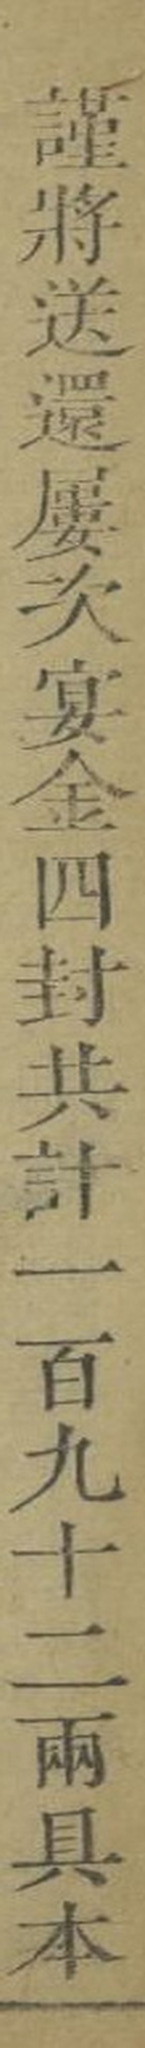謹將送還屢次宴金四封共計一百九十二兩具本
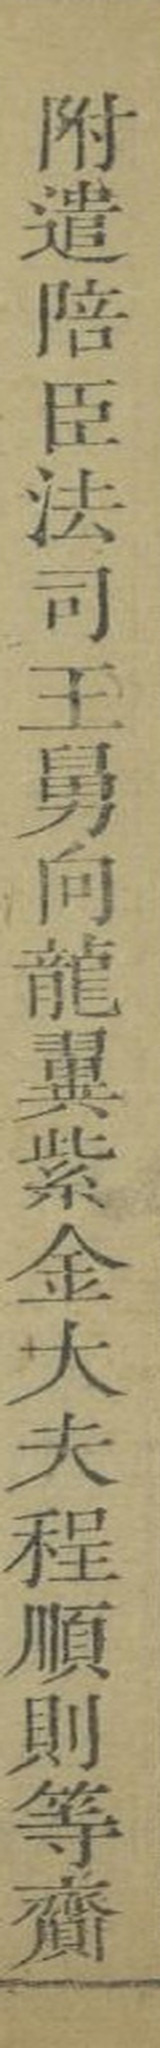附遣陪臣法司王舅向龍翼紫金大夫程順則等齎
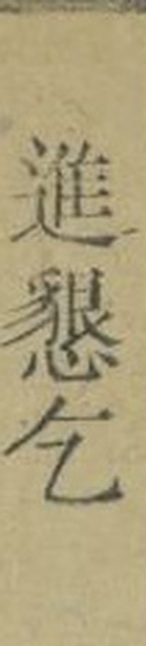進懇乞
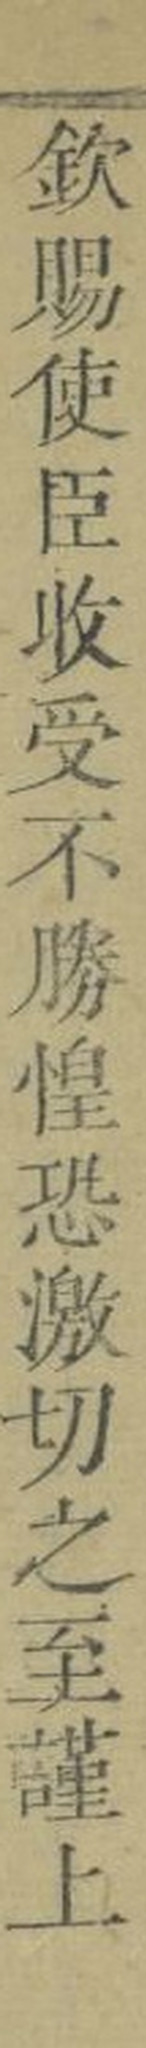欽賜使臣收受不勝惶恐激切之至謹上
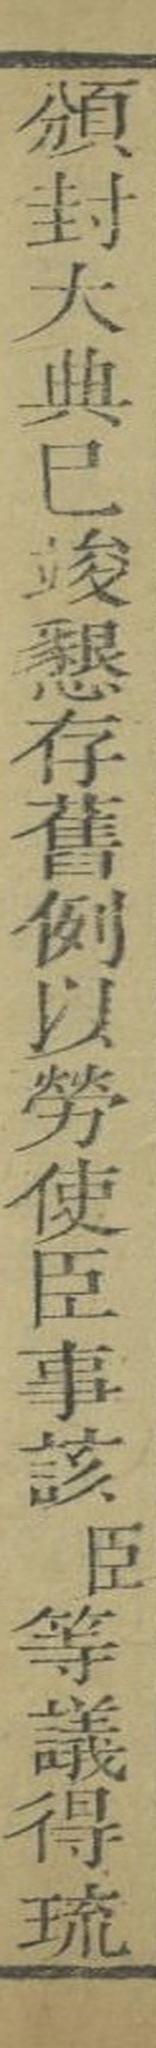領封大典巳竣懇存舊例以勞使臣事該臣等議得琉
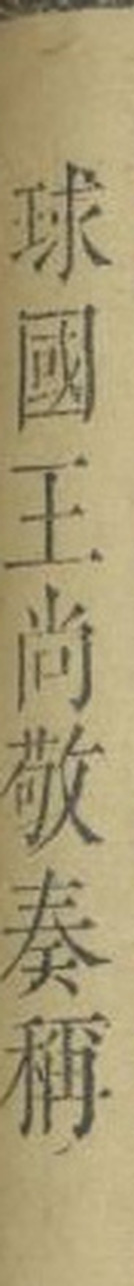球國王尚敬奏稱
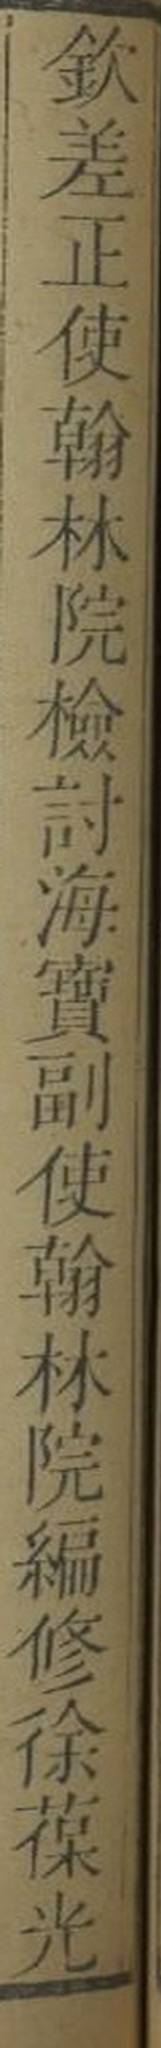欽差正使翰林院檢討海寶副使翰林院編修徐葆光
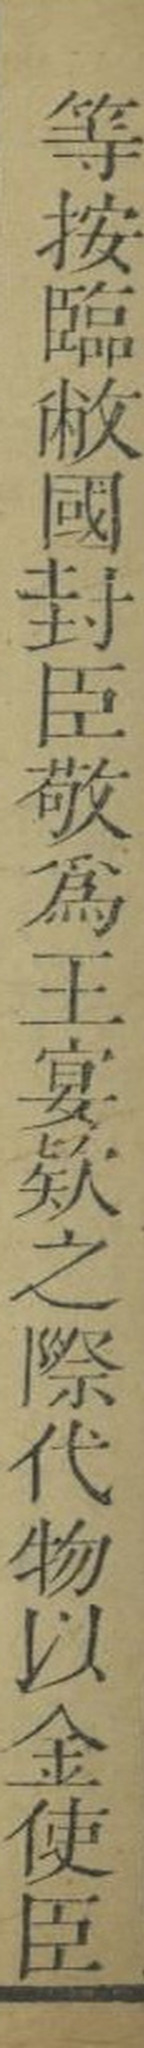等按臨敝國封臣敬爲王宴欵之際代物以金使臣
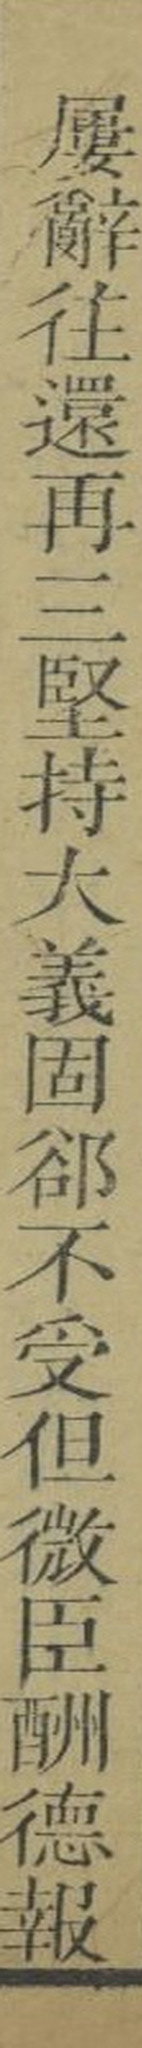屢辭往還再三堅持大義固郤不受但微臣酬德報
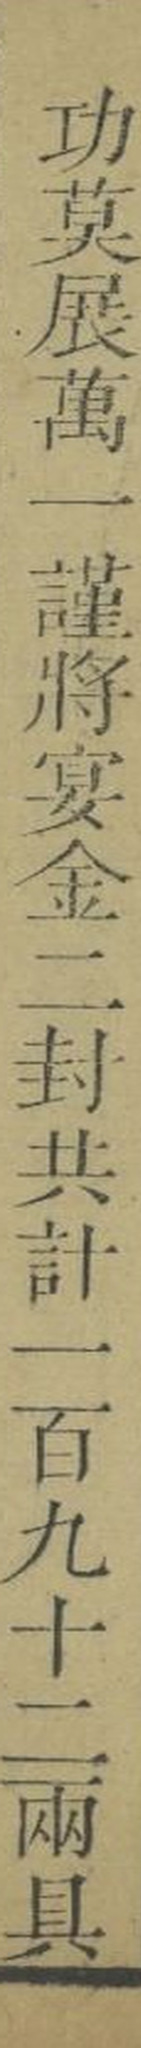功莫展萬一謹將宴金二封共計一百九十二兩具
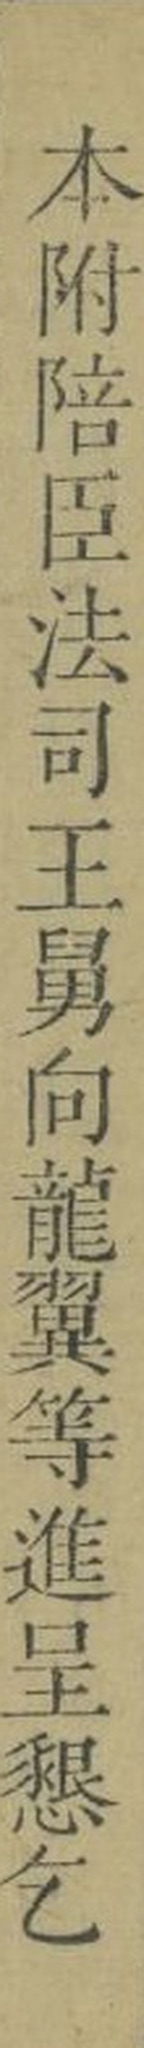本附陪臣法司王舅向龍翼等進呈懇乞
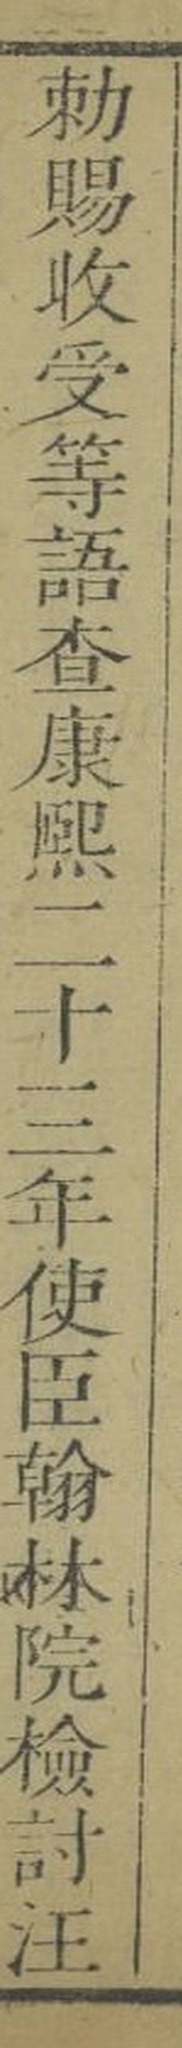勅賜收受等語査康煕二十三年使臣翰林院檢討汪
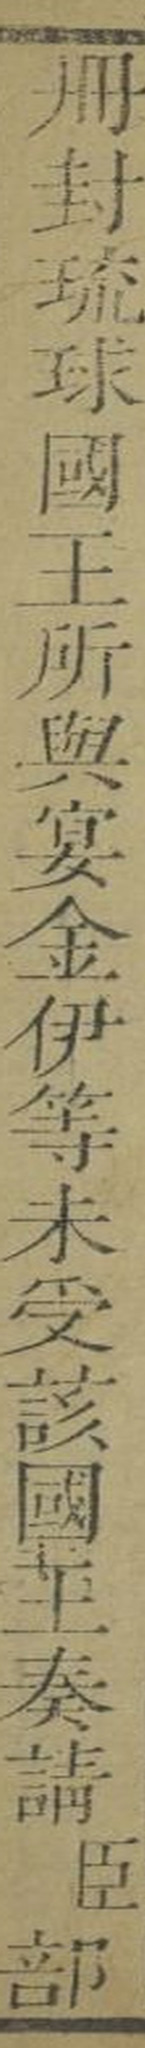冊封琉球國王所與宴金伊等未受該國王奏請臣部
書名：中山伝信録 巻二
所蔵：University of the Ryukyus Library
